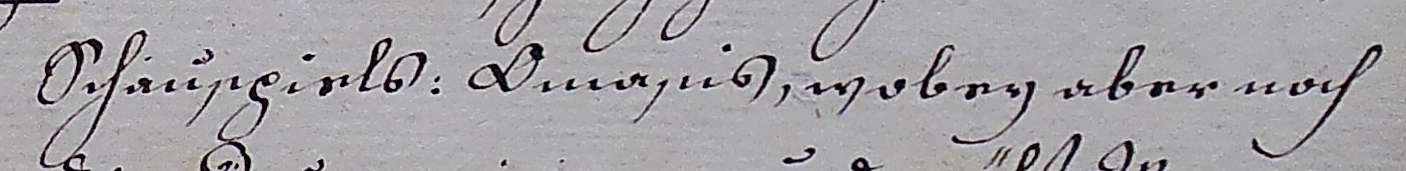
Schauspiels: Omasis, wobey aber noch
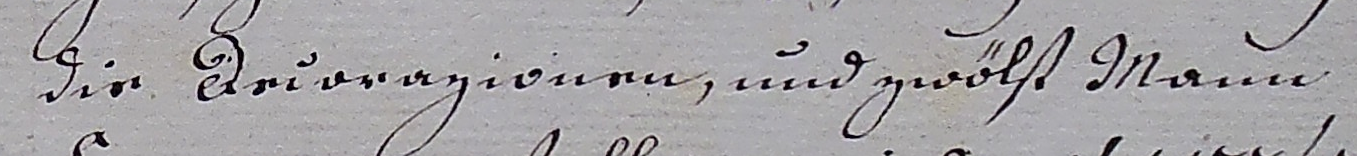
die Decorazionen, und zwölf Mann
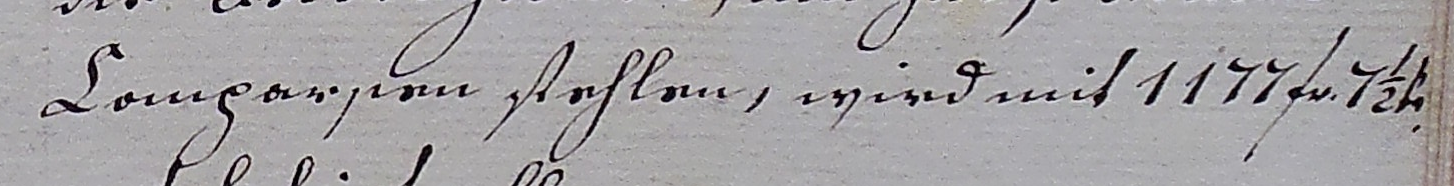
Comparsen fehlen, wird mit 1177fr 7½kr.
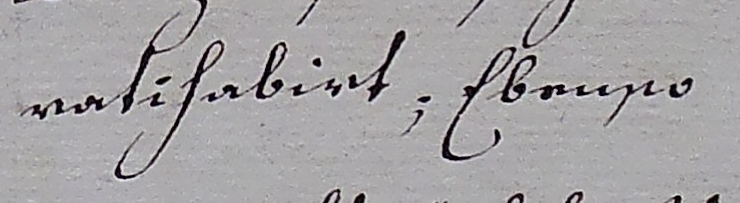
ratihabirt; Ebenso
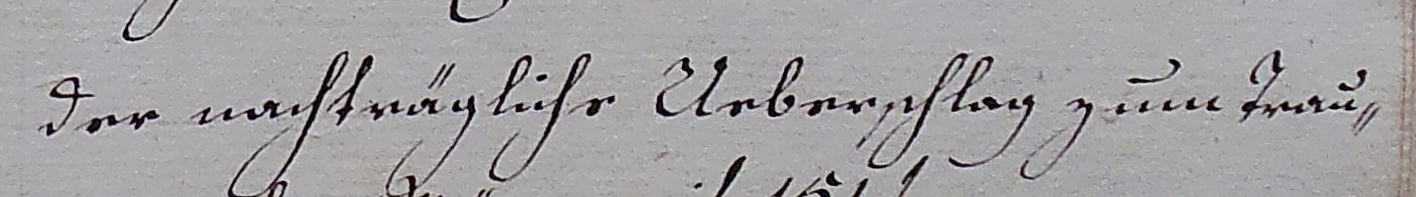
der nachträgliche Ueberschlag zum Trau¬
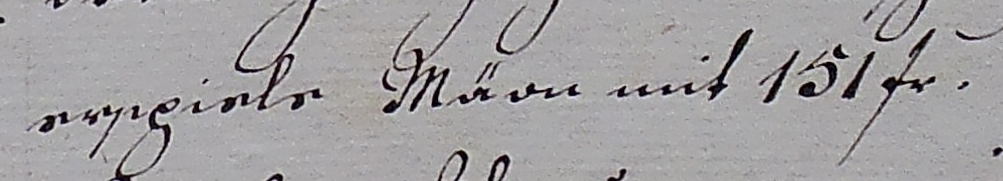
erspiele Mäon mit 151fr.
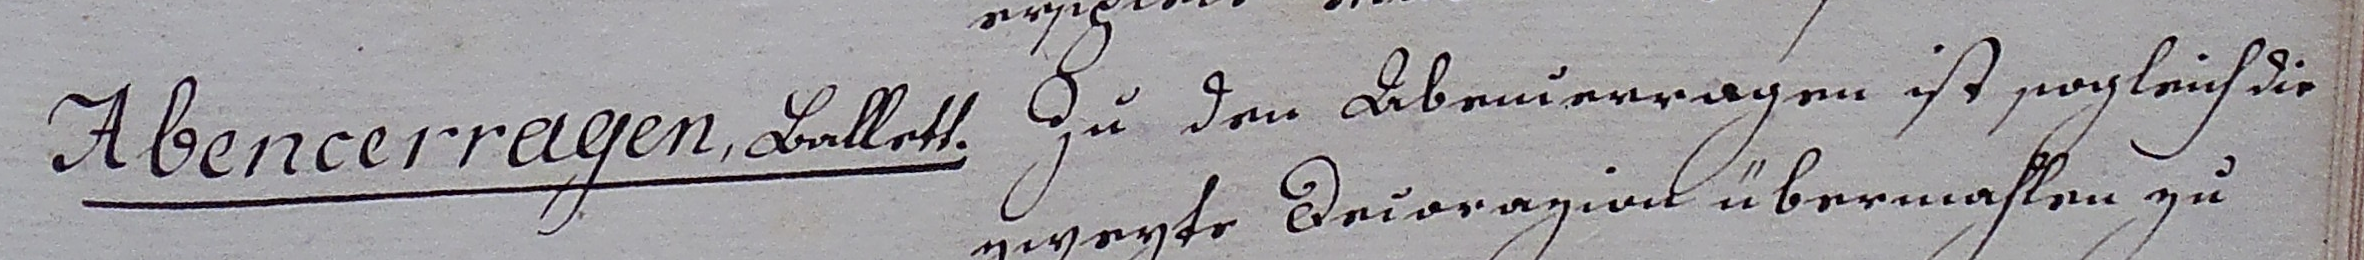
Abencerragen, Ballett. Zu den Abencerragen ist sogleich die
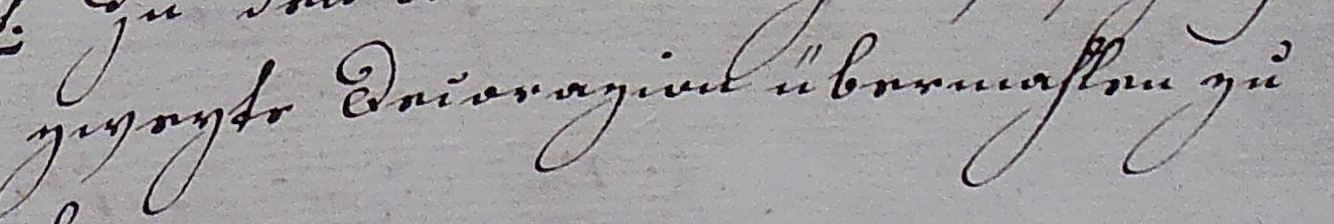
zweyte Decorazion übermahlen zu
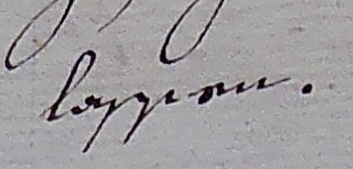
lassen.
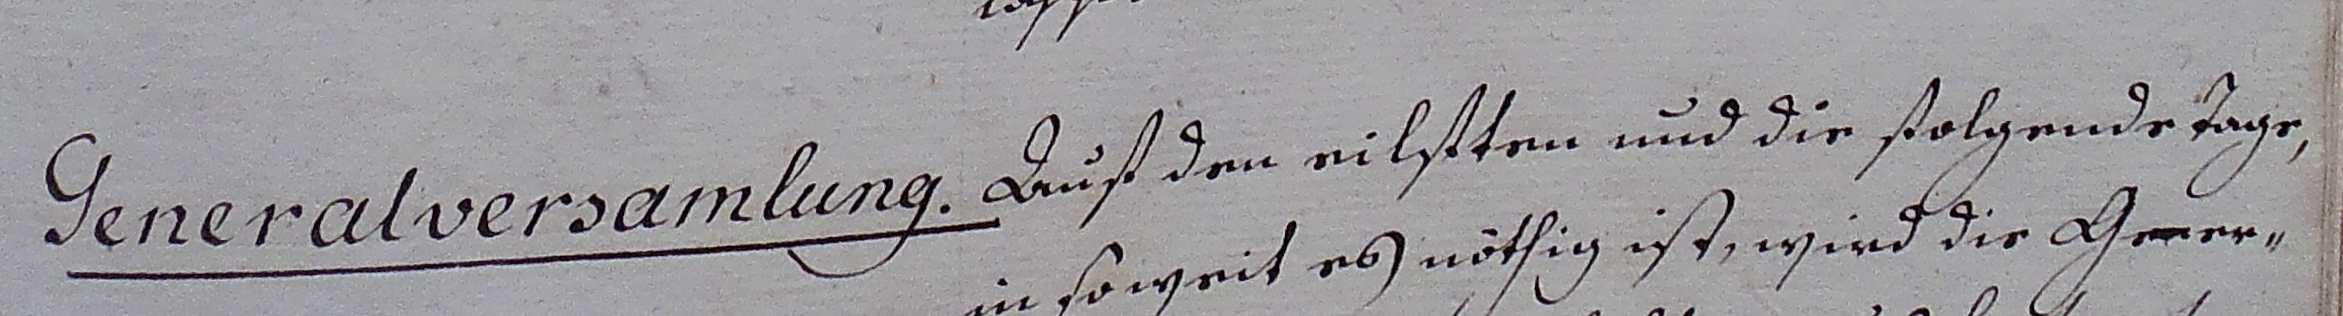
Generalversamlung. Auf den eilften und die folgende Tage,
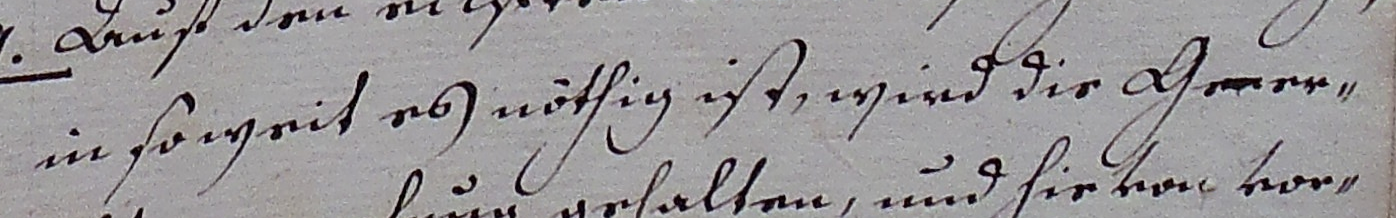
in soweit es nöthig ist, wird die Gener¬
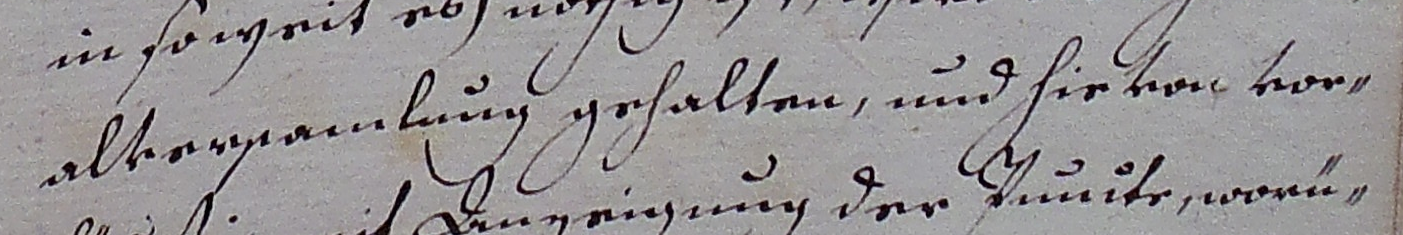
alversamlung gehalten, und hievon vor¬
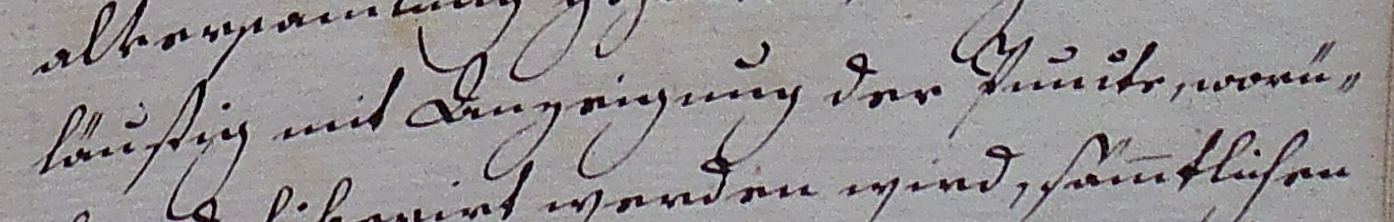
läufig mit Anzeigung der Puncte, worü¬
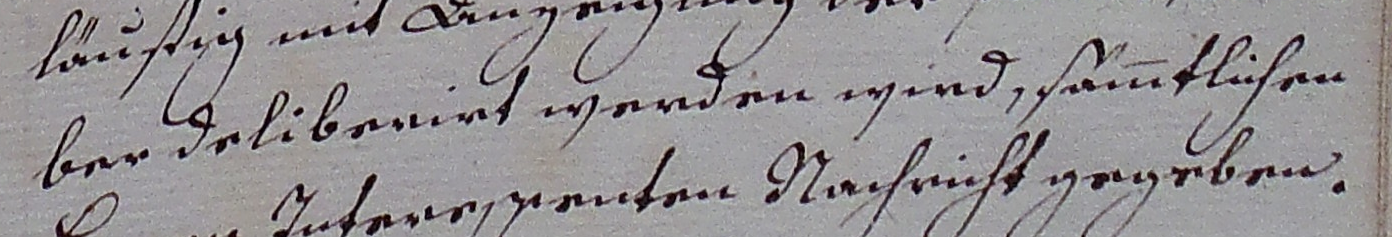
ber deliberirt werden wird, säm̅tlichen
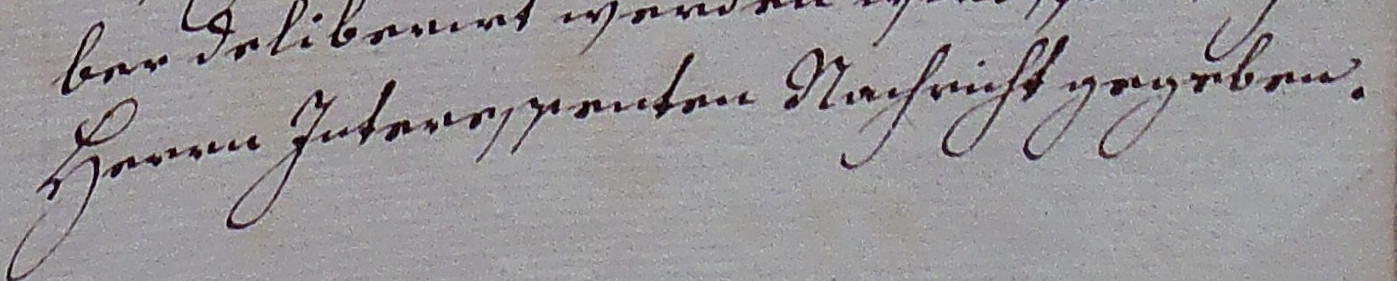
Herrn Interessenten Nachricht gegeben.
